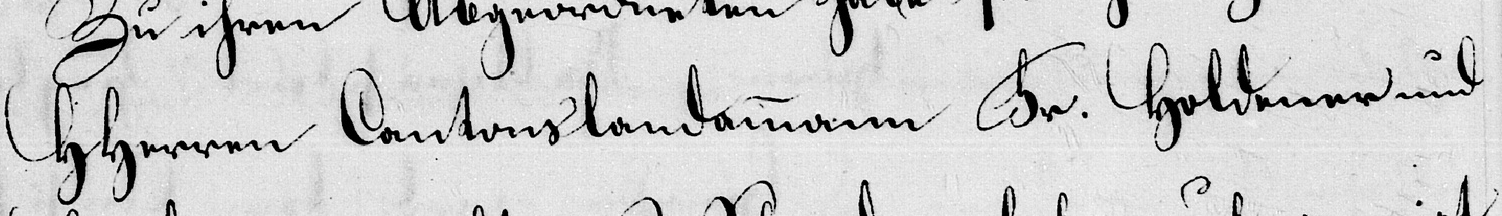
HHerren Cantonslandammann Fr. Holdener und
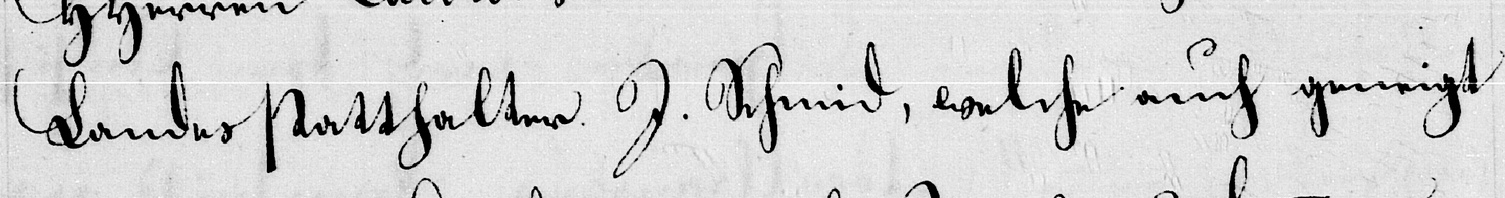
Landesstatthalter J. Schmid, welche auch geneigt
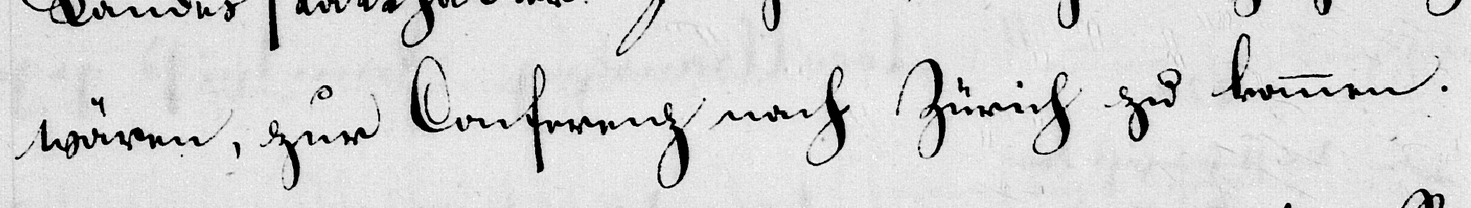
wären, zur Conferenz nach Zürich zu kommen.
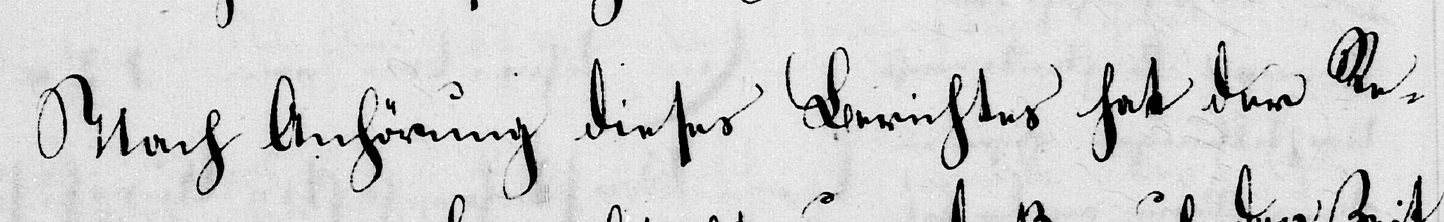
Nach Anhörung dieses Berichtes hat der Re¬
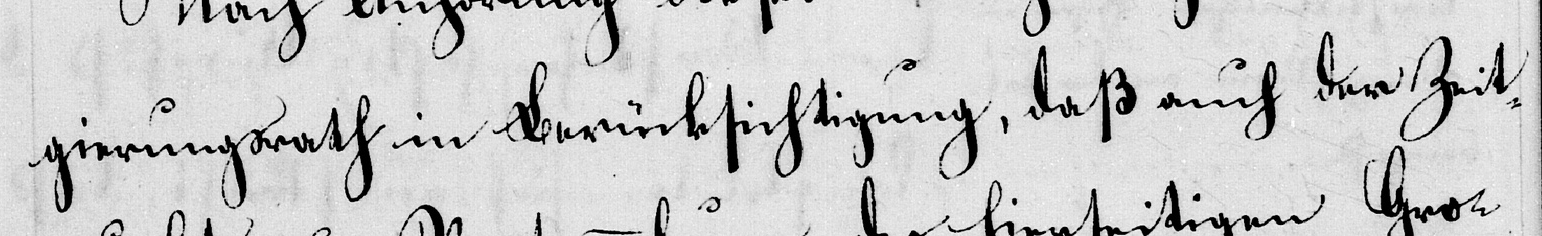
gierungsrath in Berücksichtigung, daß auch der Zeit¬
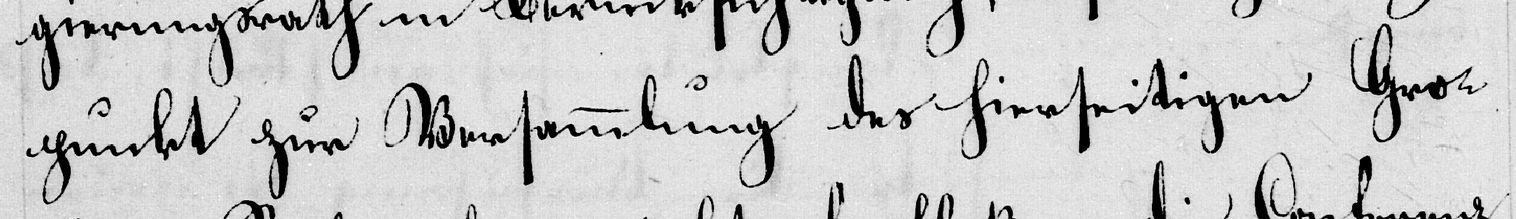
punkt zur Versammlung des hierseitigen Groß¬
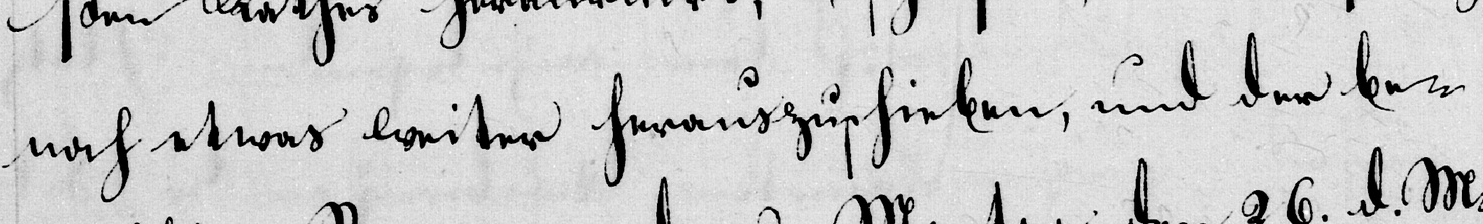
noch etwas weiter herauszuschieben, und der be¬
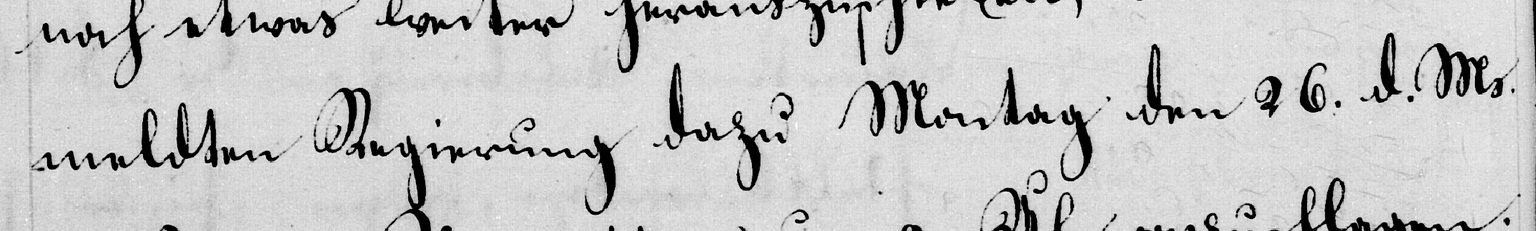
meldten Regierung dazu Montag den 26. d. Ms.
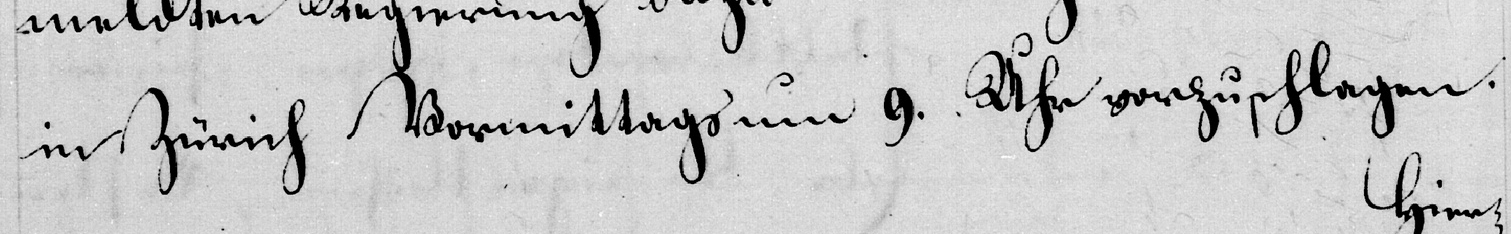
in Zürich Vormittags um 9. Uhr vorzuschlagen.
